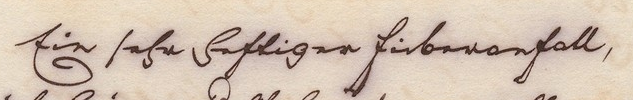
Ein sehr heftiger Fieberanfall,
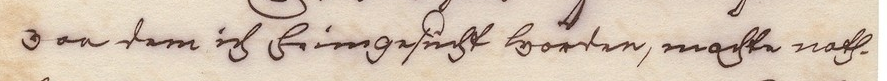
von dem ich heimgesucht worden, machte noth-
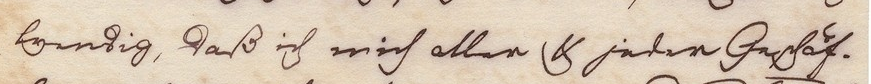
wendig, daß ich mich aller & jeder Geschäf-
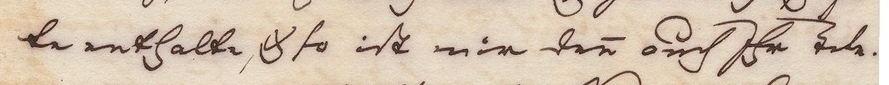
te enthalte, & so ist mir denn auch Ihr Tele-
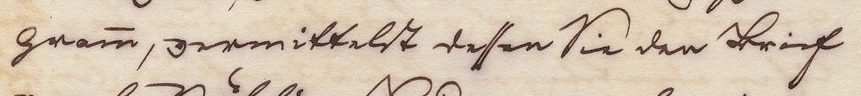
gramm, vermittelst dessen Sie den Brief
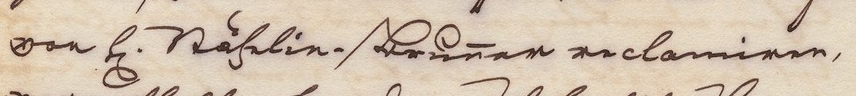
von H. Stähelin-Brunner reclamiren,
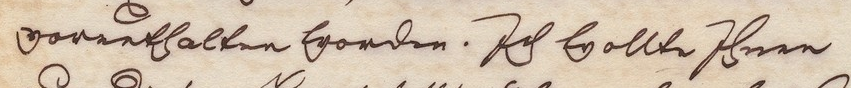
vorenthalten worden. Ich wollte Ihnen
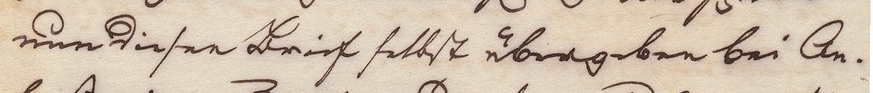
nun diesen Brief selbst übergeben bei An-
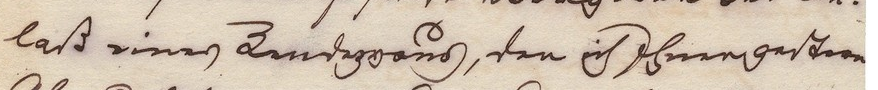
laß eines Rendezvous, den ich Ihnen gestern
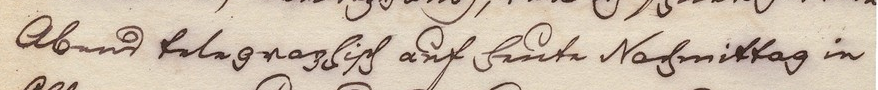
Abend telegraphisch auf heute Nachmittag in
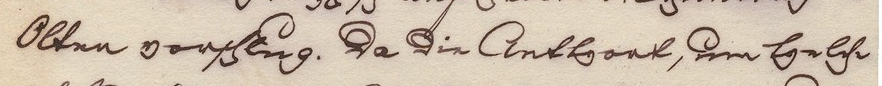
Olten vorschlug. Da die Antwort, um welche
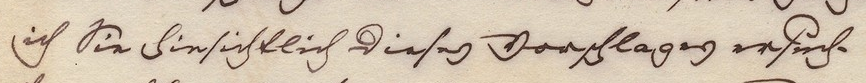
ich Sie hinsichtlich dieses Vorschlages ersuch-
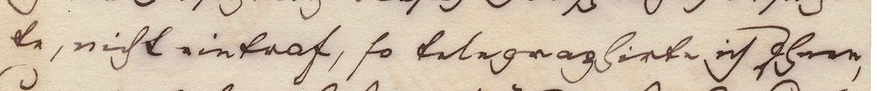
te, nicht eintraf, so telegraphirte ich Ihnen,
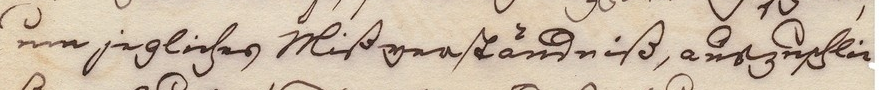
um jegliches Mißverständniß, auszuschlie-
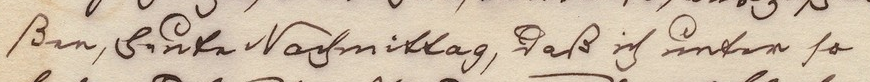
ßen, heute Nachmittag, daß ich unter so
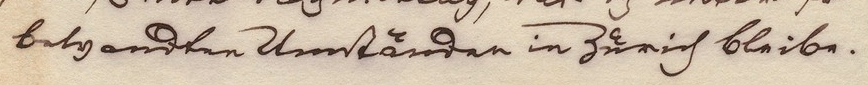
bewandten Umständen in Zürich bleibe.
